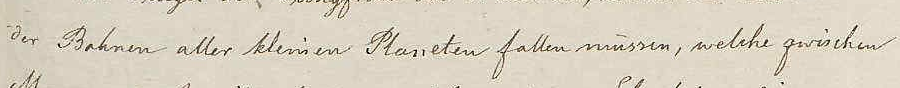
der Bahnen aller kleinen Planeten fallen müssen, welche zwischen
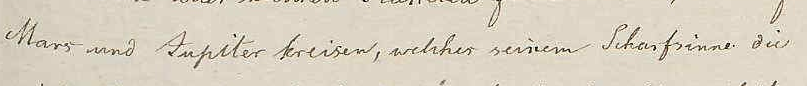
Mars und Jupiter kreisen, welcher seinem Scharfsinne die
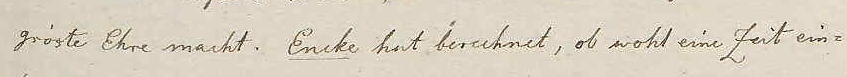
gröste Ehre macht. Encke hat berechnet, ob wohl eine Zeit ein-
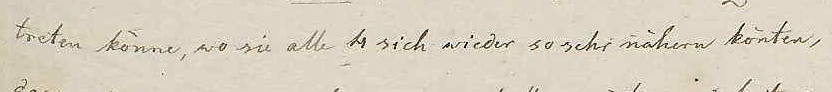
treten könne, wo sie alle 4 sich wieder so sehr nähern könten,
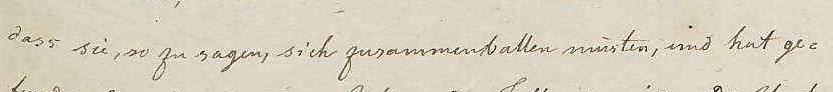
dass sei, so zu sagen, sich zusammenballen müsten, und hat ge-
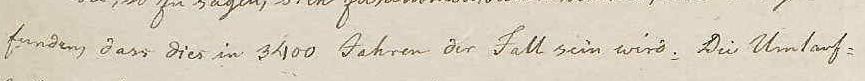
funden, dass dies in 3400 Jahren der Fall sein wird. Die Umlauf-
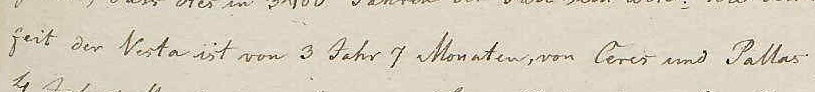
zeit der Vesta ist von 3 Jahr 7 Monaten, von Ceres und Pallas
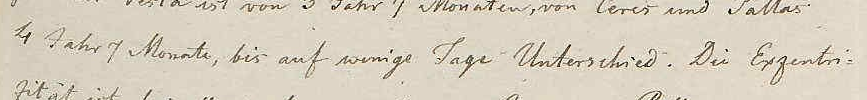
4 Jahr 7 Monate, bis auf wenige Tage Unterschied. Die Exzentri-
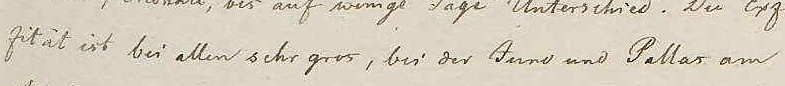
zität ist bei allen sehr gros, bei der Juno und Pallas am
